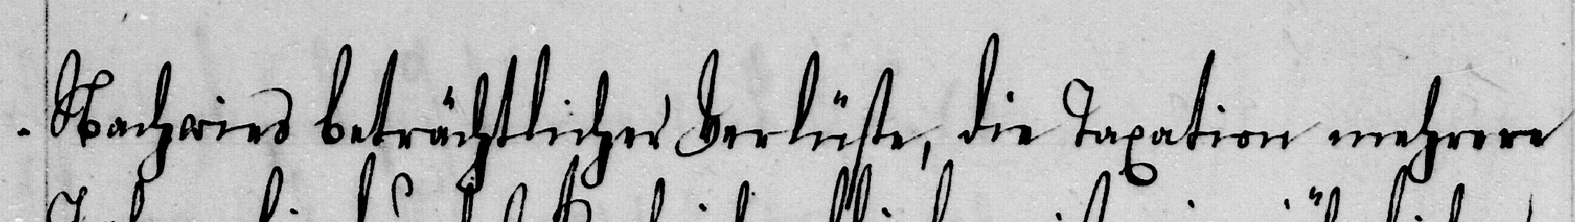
Nachweis Beträchtlicher Verlüste, die Taxation mehrere
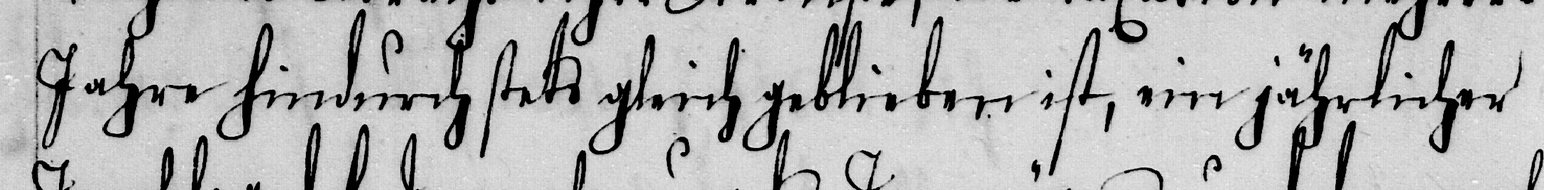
Jahre hindurch stets gleich geblieben ist, ein jährlicher
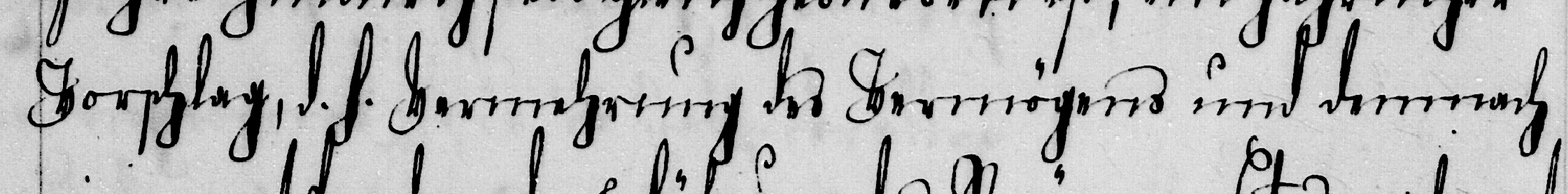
Vorschlag, d. h. Vermehrung des Vermögens und demnach
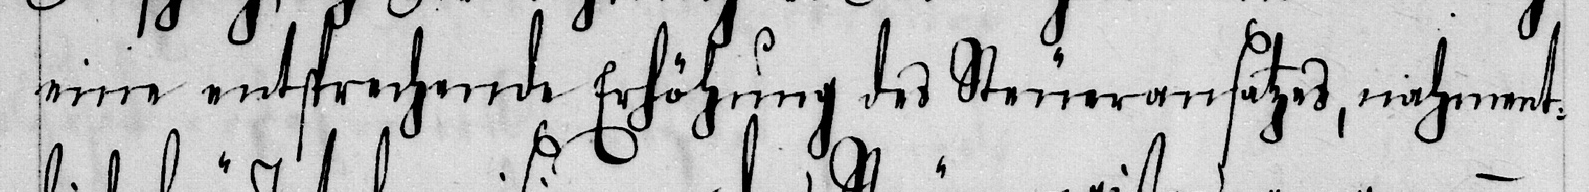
eine entsprechende Erhöhung des Steueransatzes, nahment¬
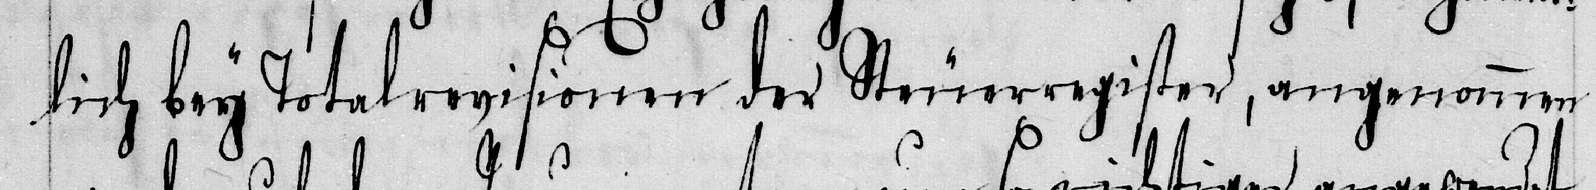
lich bey Totalrevisionen der Steuerregister, angenommen
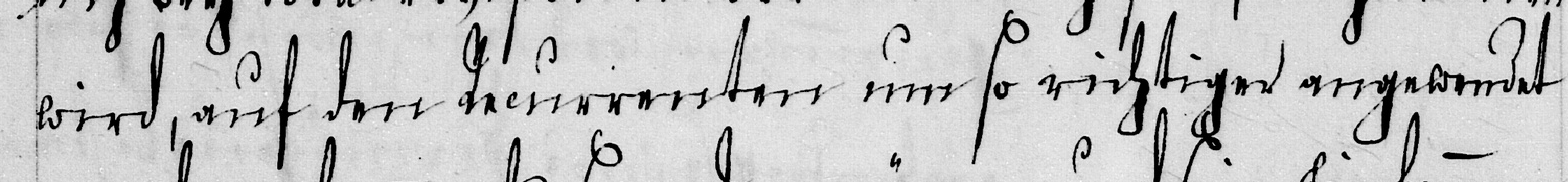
wird, auf den Recurrenten um so richtiger angewendet
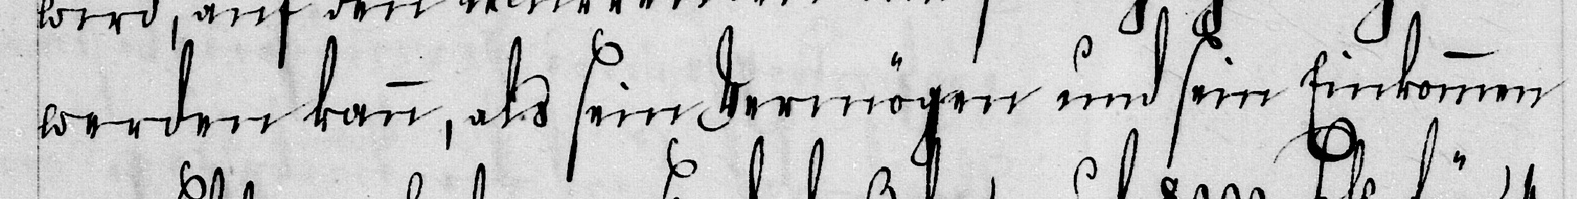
werden kann, als sein Vermögen und sein Einkommen
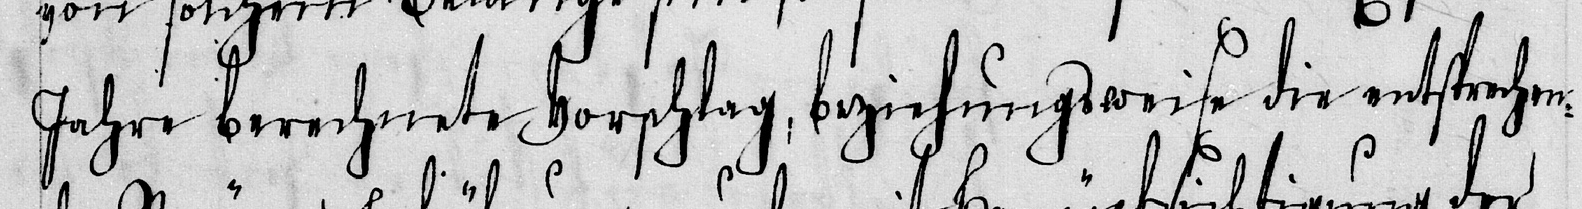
Jahre berechnete Vorschlag, beziehungsweise die entspreche¬
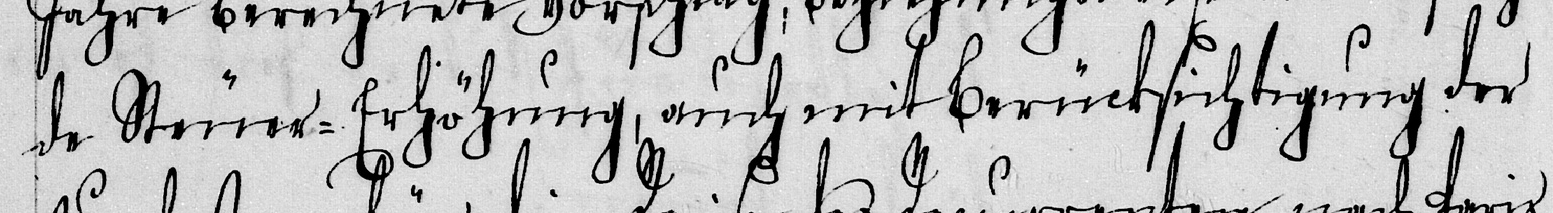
nde Steuer-Erhöhung, auch mit Berücksichtigung der
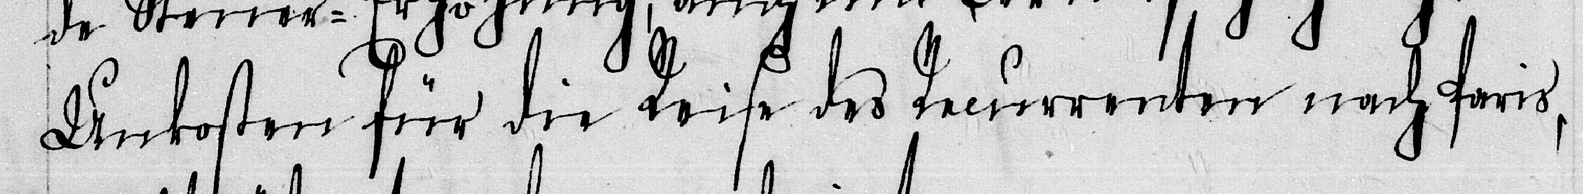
Unkosten für die Reise des Recurrenten nach Paris,
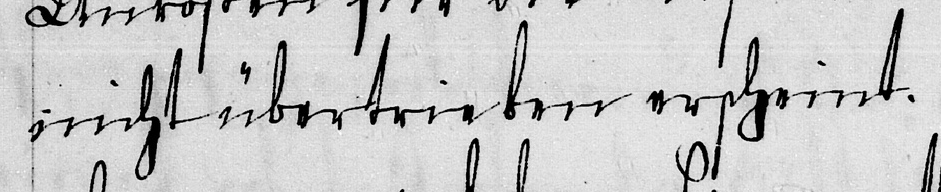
nicht übertrieben erscheint.
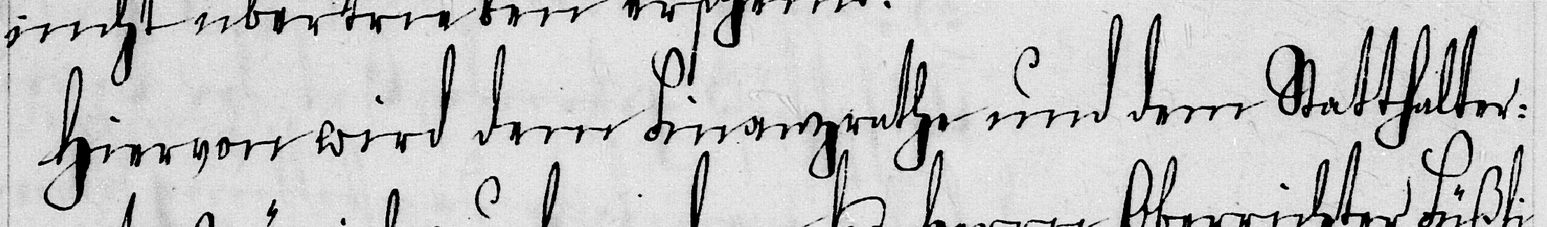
Hiervon wird dem Finanzrathe und dem Statthalte¬
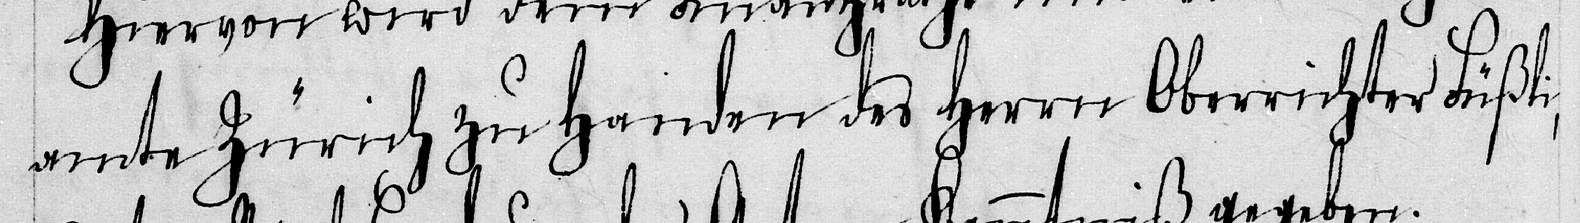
ramte Zürich zu Handen des Herrn Oberrichter Füßli,
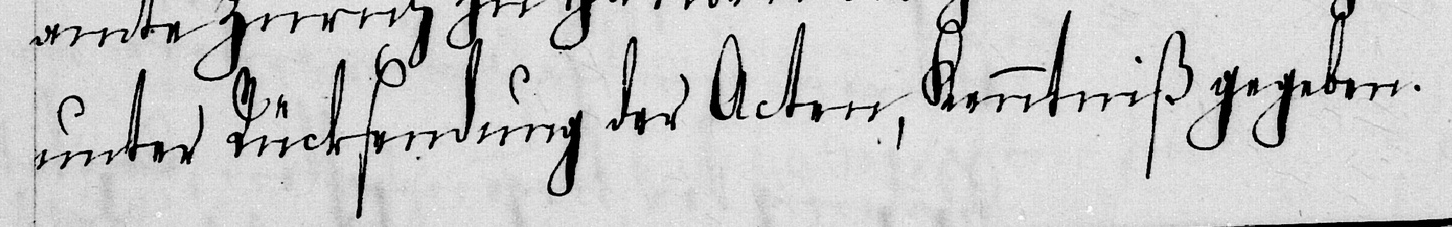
unter Rücksendung der Acten, Kenntniß gegeben.
